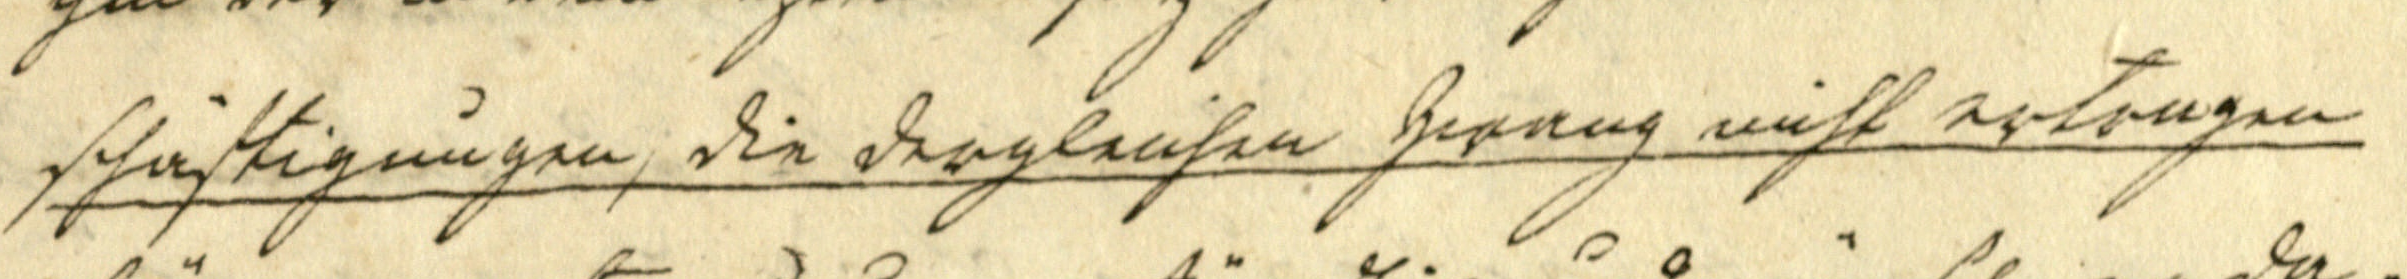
schäftigungen, die dergleichen Zwang nicht ertragen
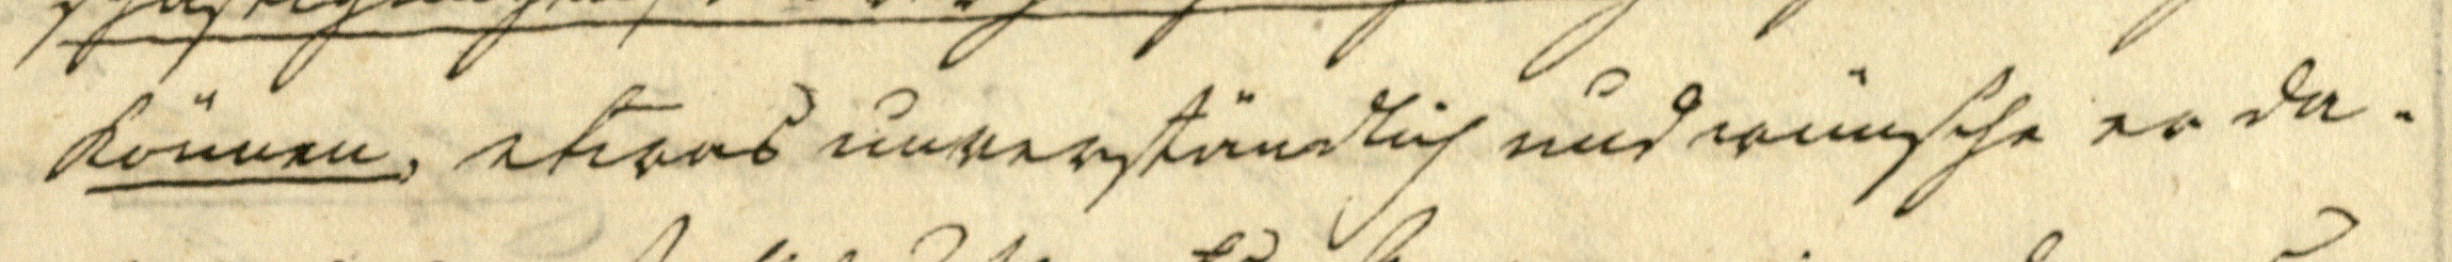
können, etwas unverständlich und wünsche er da¬
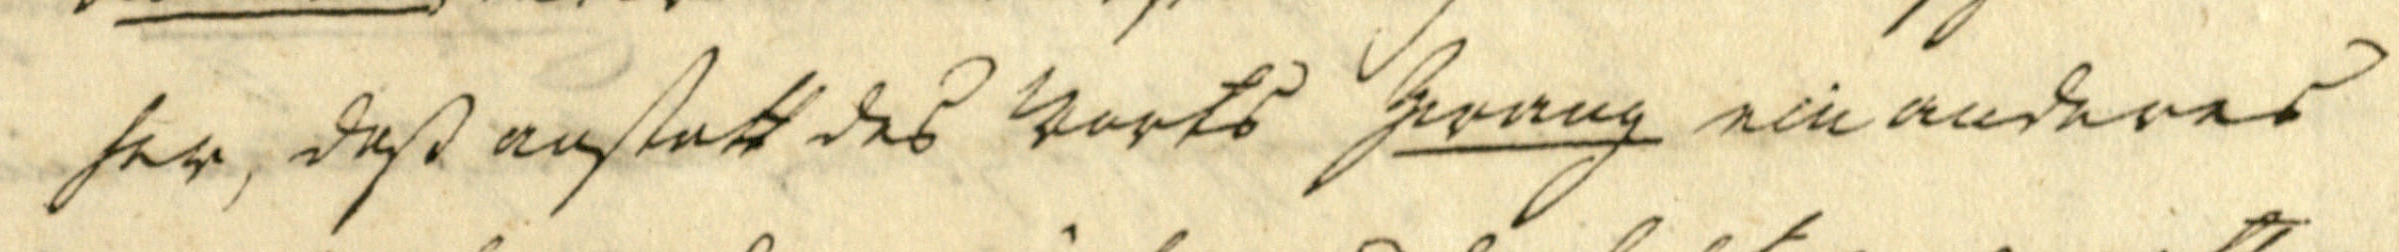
her, daß anstatt des Worts Zwang ein anderes
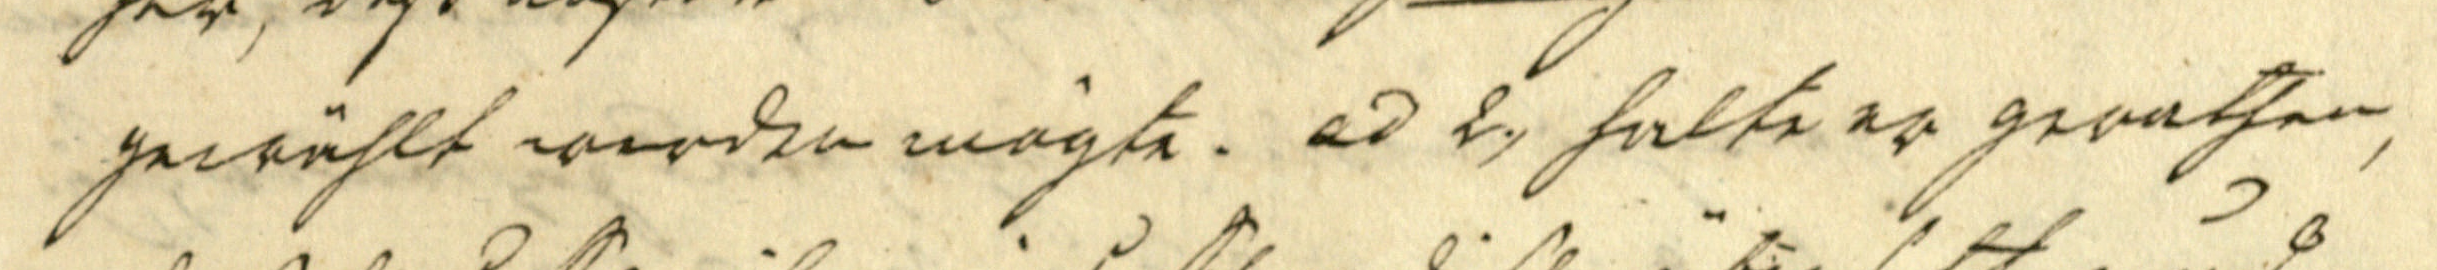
gewählt werden mögte. ad 2., halte er gerathen,
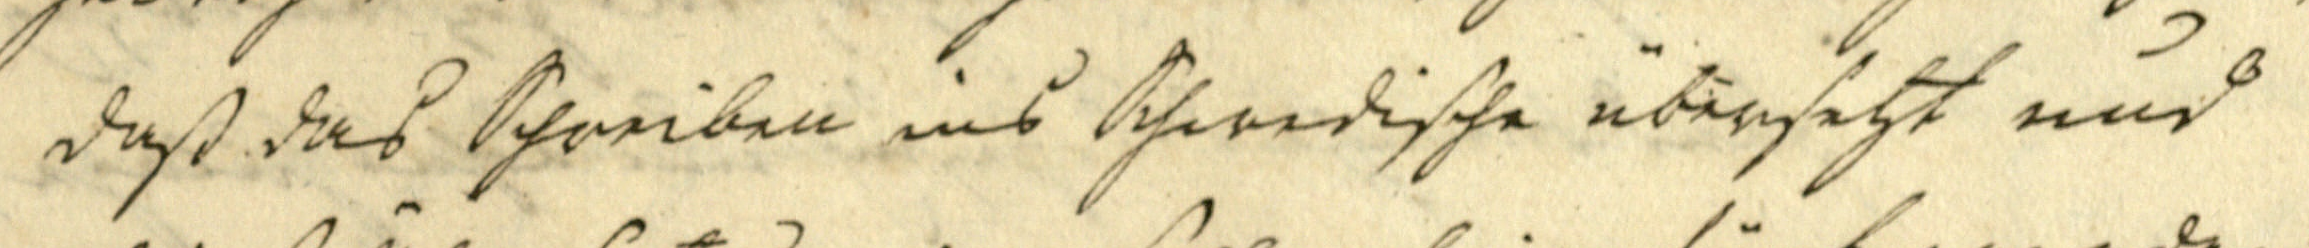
daß das Schreiben ins Schwedische übersetzt und
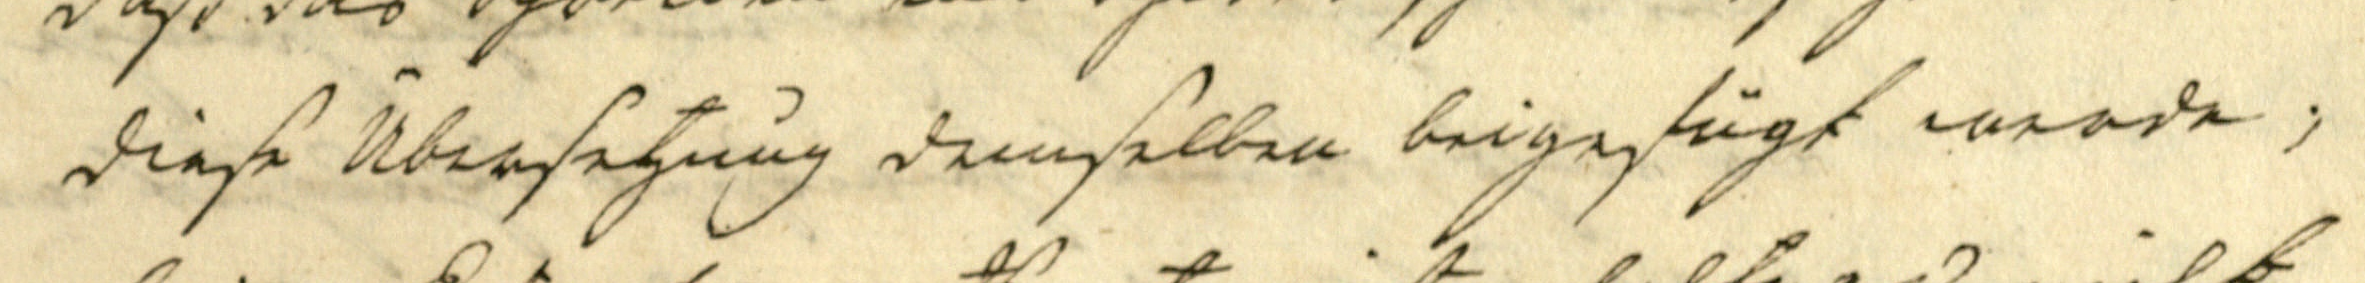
diese Übersetzung demselben beigefügt werde;
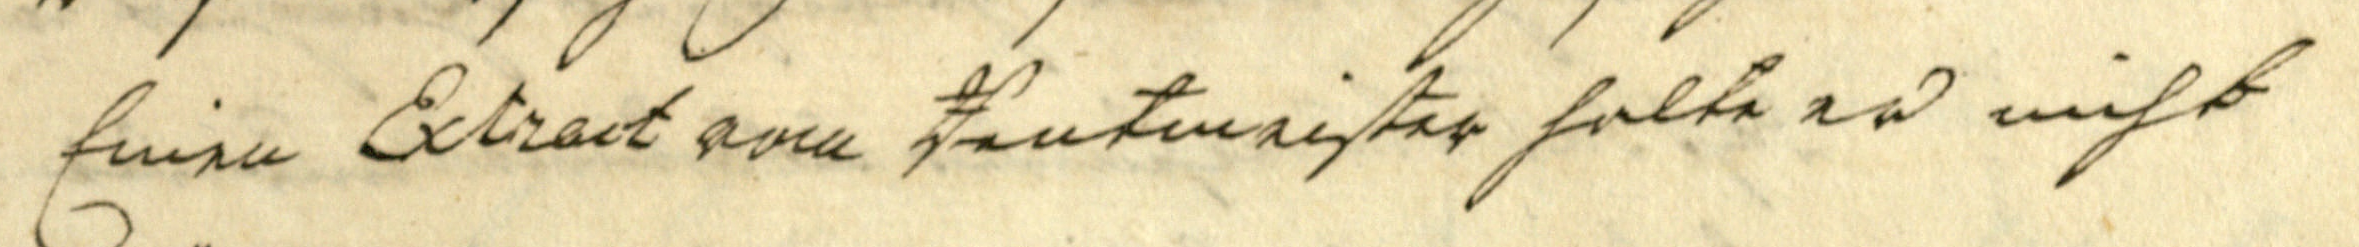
Einen Extract vom Rentmeister halte er nicht
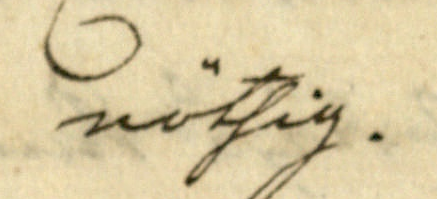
nöthig.
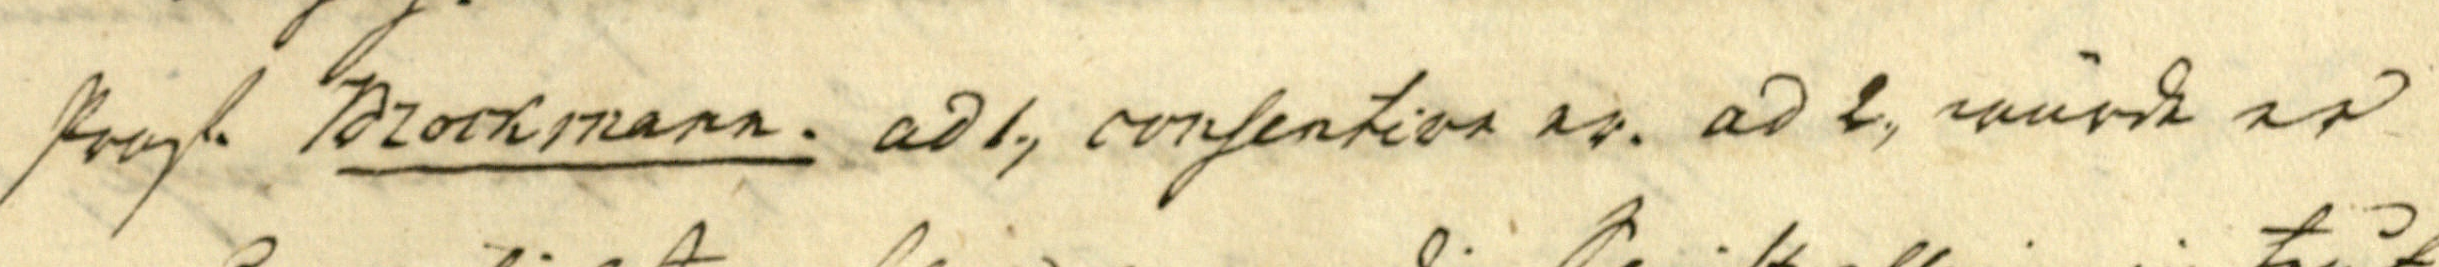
Prof. Brockmann. ad 1., consentive er. ad 2, würde er
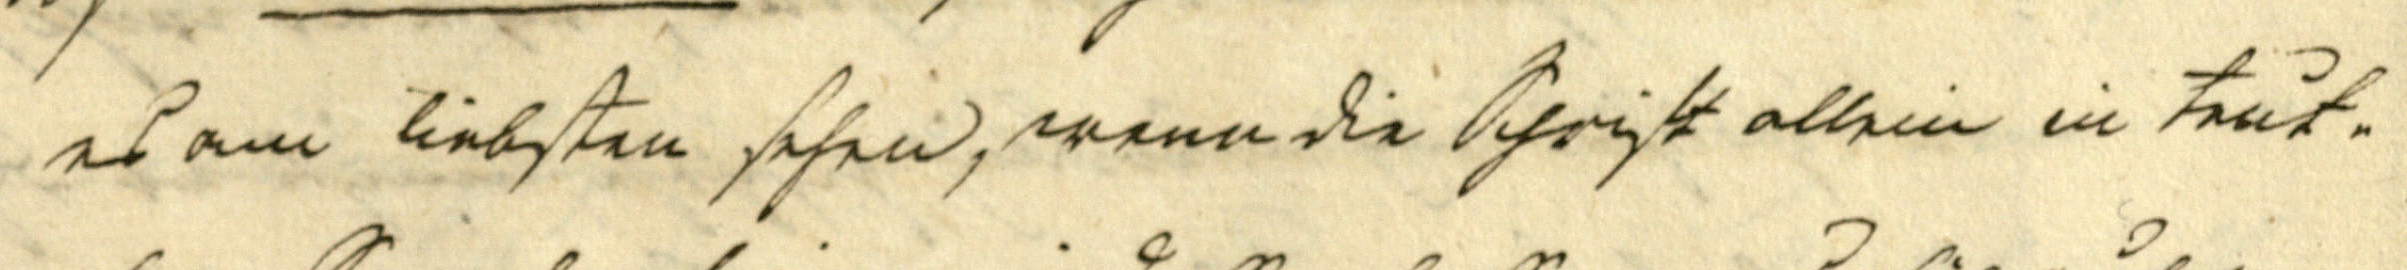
es am liebsten sehen, wenn die Schrift allein in teut¬
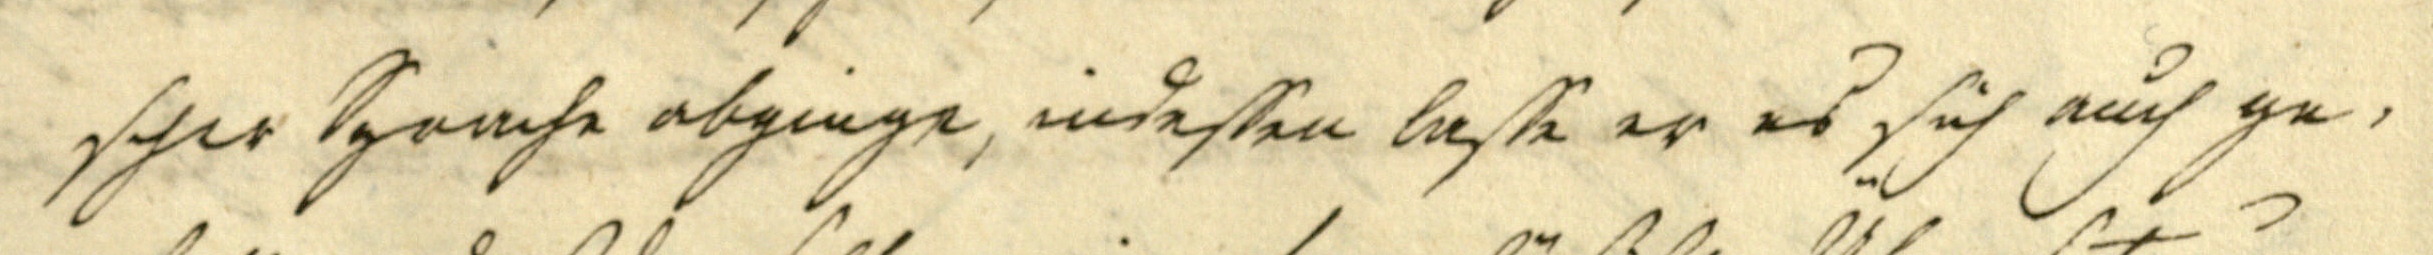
scher Sprache abginge, indessen lasse er es sich auch ge¬
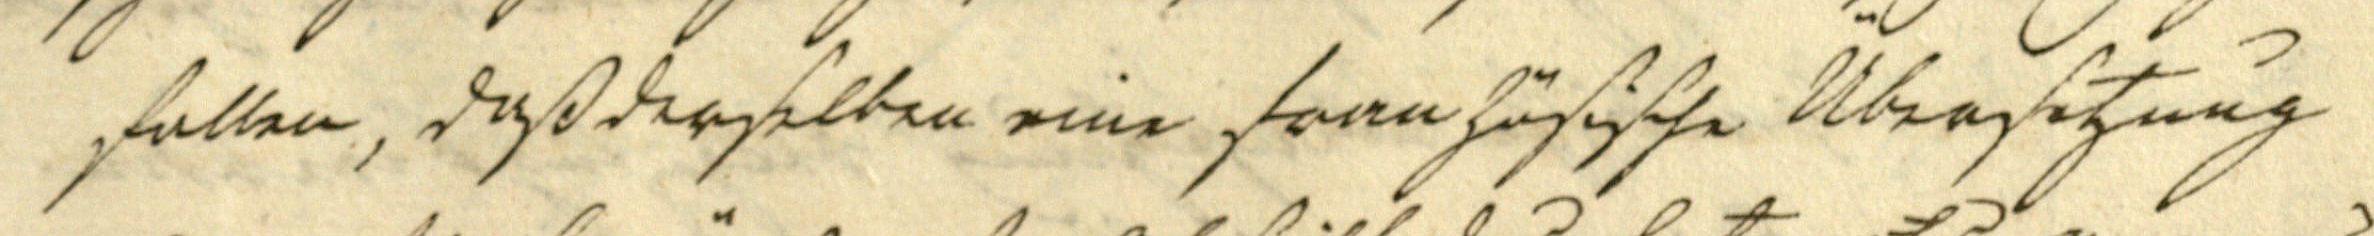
fallen, daß derselben eine französische Übersetzung
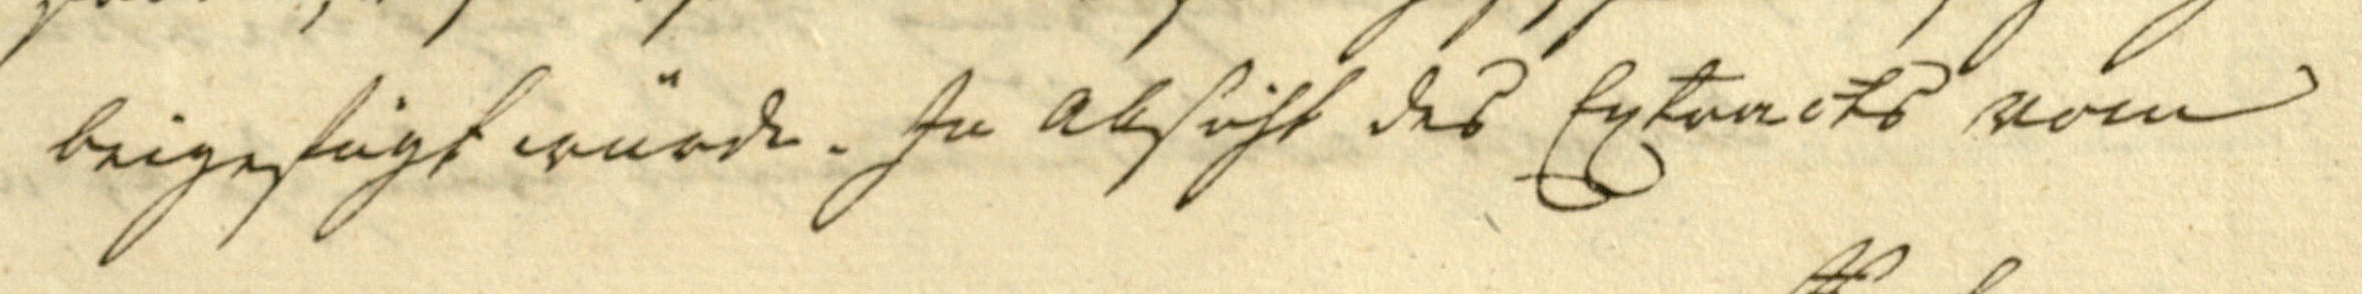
beigefügt würde. In Absicht des Extracts vom
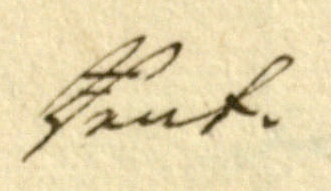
Rent.
